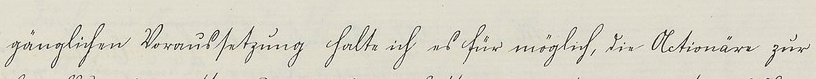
gänglichen Voraussetzung halte ich es für möglich, die Actionäre zur
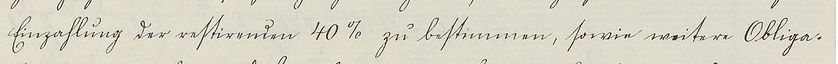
Einzahlung der restirenden 40% zu bestimmen, sowie weitere Obliga-
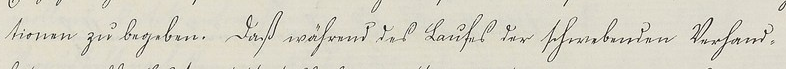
tionen zu begeben. Daß während des Laufes der schwebenden Verhand-
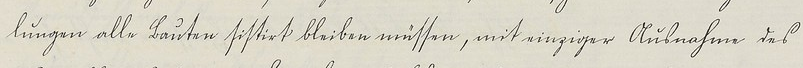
lungen alle Bauten sistirt bleiben müssen, mit einziger Ausnahme des
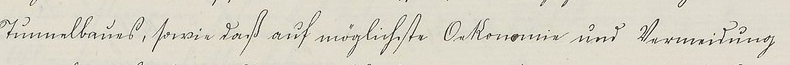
Tunnelbaues, sowie daß auf möglichste Oekonomie und Vermeidung
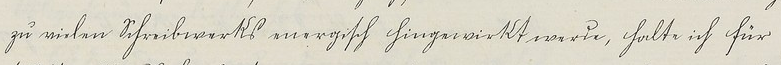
zu vielen Schreibwerks energisch hingewirkt werde, halte ich für
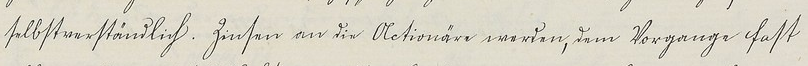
selbstverständlich. Zinsen an die Actionäre werden, dem Vorgange fast
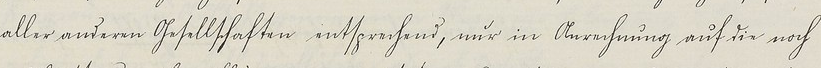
aller anderen Gesellschaften entsprechend, nur in Anrechnung auf die noch
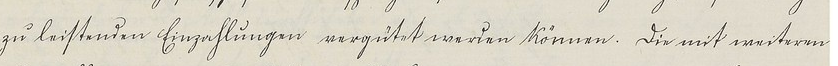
zu leistenden Einzahlungen vergütet werden können. Die mit weiteren
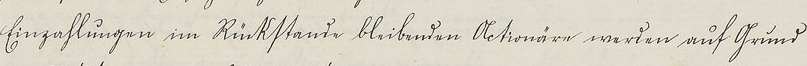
Einzahlungen im Rückstande bleibenden Actionäre werden auf Grund
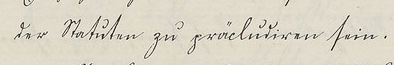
der Statuten zu präcludiren sein.
